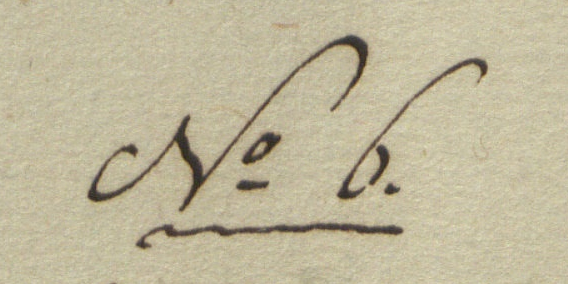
No. 6.
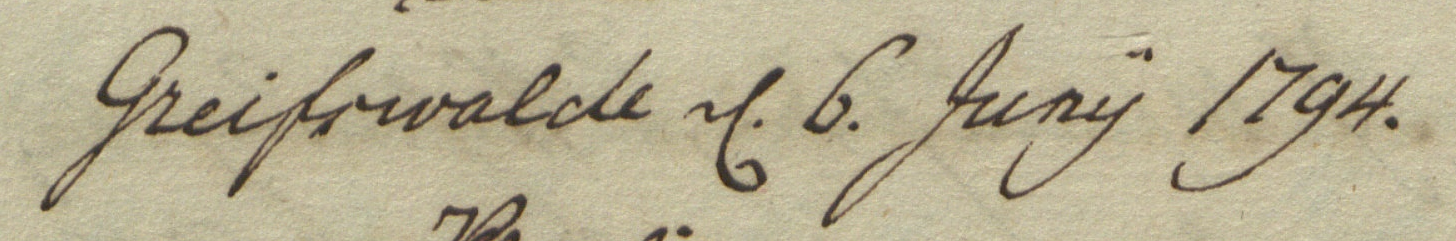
Greifswalde d. 6. Juny 1794
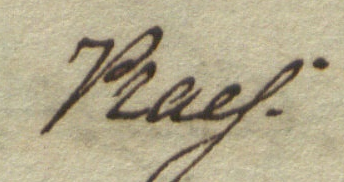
Praes.
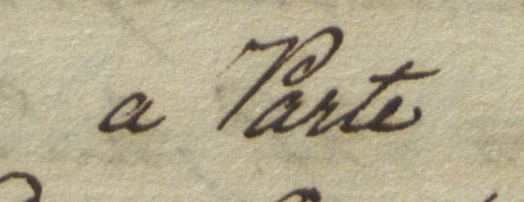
a Parte
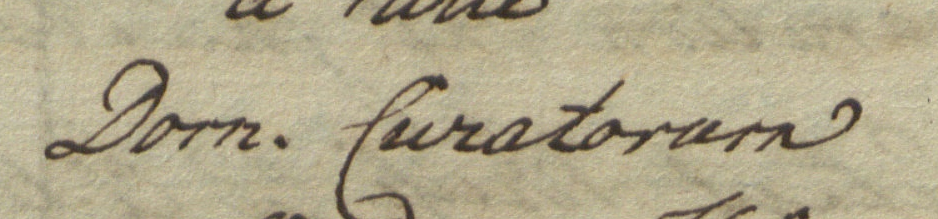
Dom. Curatorum
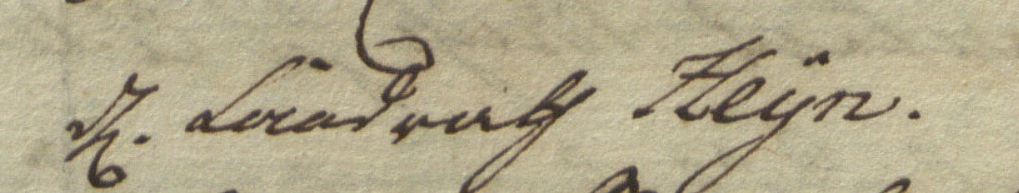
dh. Landrath Heyn
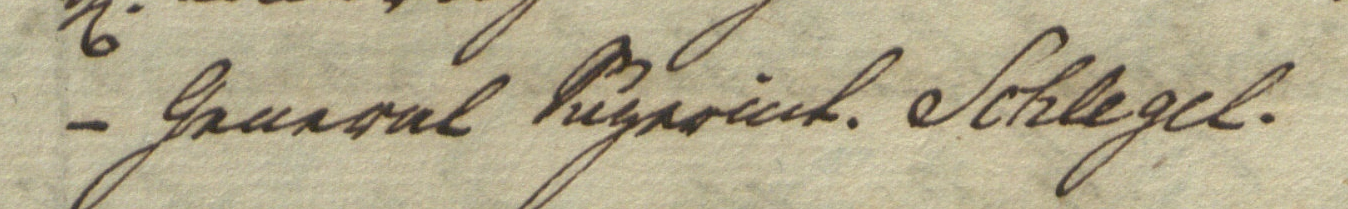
- General Superint. Schlegel.
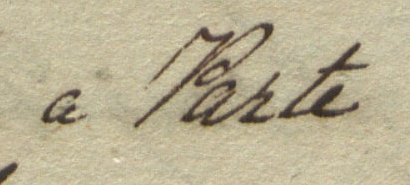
a Parte
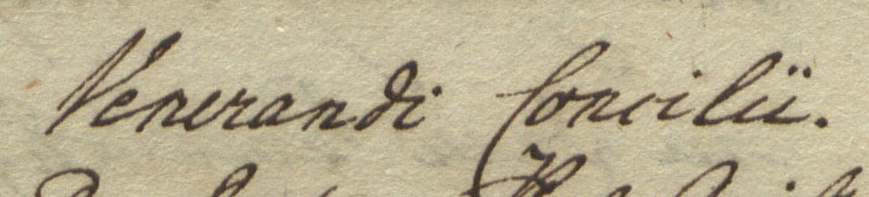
Venerandi Concilii
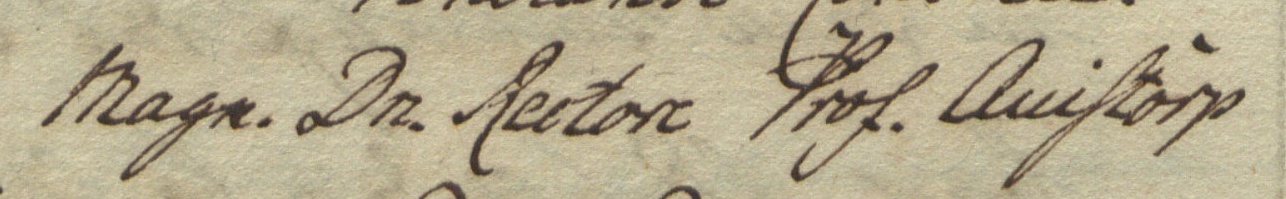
Magn. Dn. Rectore Prof. Quistorp
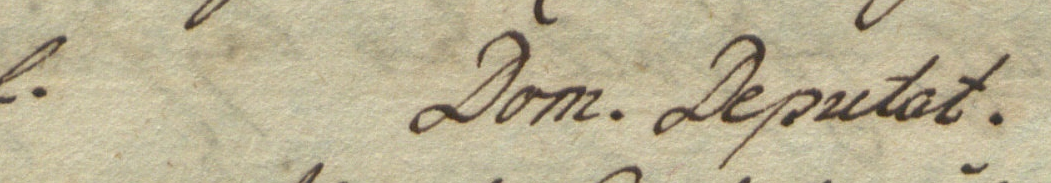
Dom. Deputat.
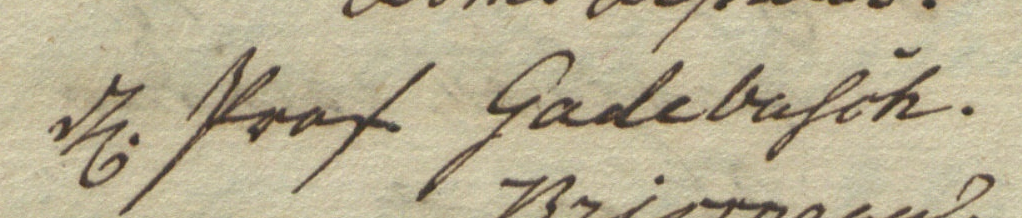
dh. Prof. Gadebusch.
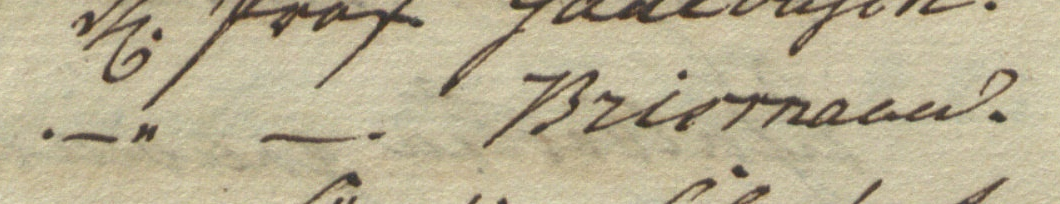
" - " - " Brismann.
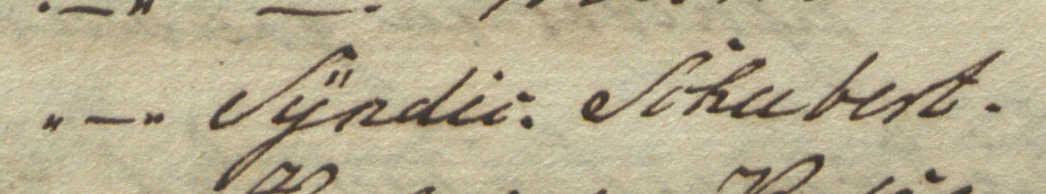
" - " Syndic. Schubert
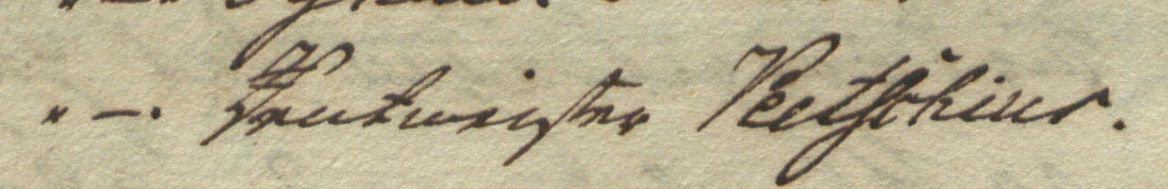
" - " Rentmeister Peetschius
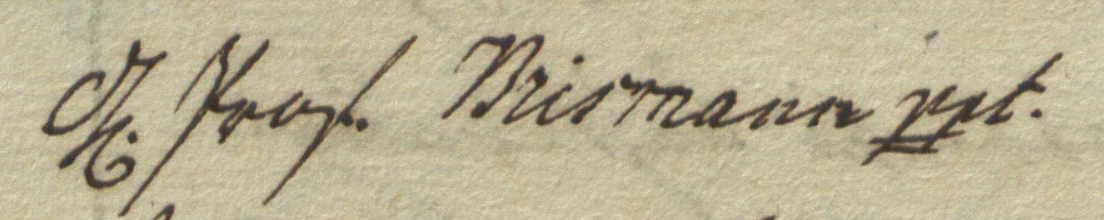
dh. Prof. Brismann ppt.
